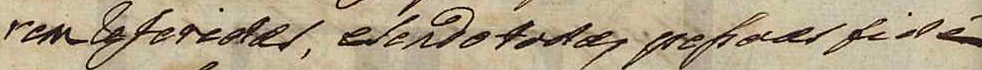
rem Referidas, e sendo todas pessoas fidé
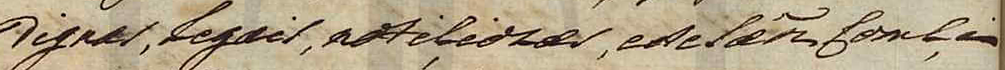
dignas, Legais, notiçiozas, e de sãn Comçi
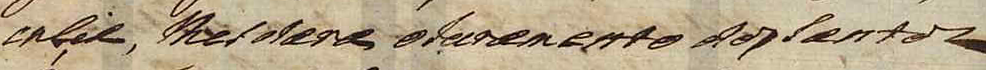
ençia, lhe selara o Iuramento dos santoz
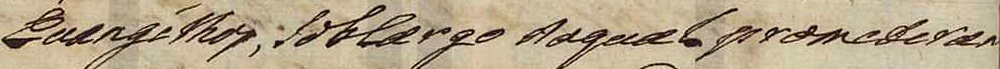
Euangélhos, sob Cargo da qual prometera
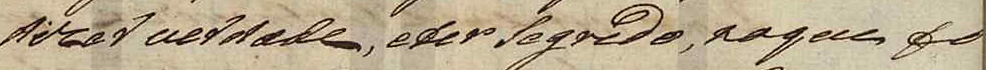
dizer uerdade, e ter segredo, no que fo
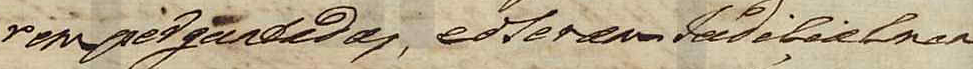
rem perguntadas, e o seram Iudicialmen
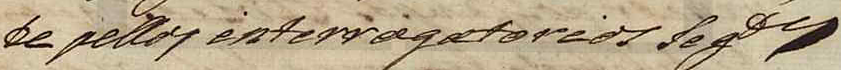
te pellos interrogatorios seg.tes
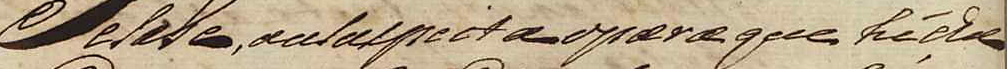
Se sabe, ou suspeita o para que hé çha
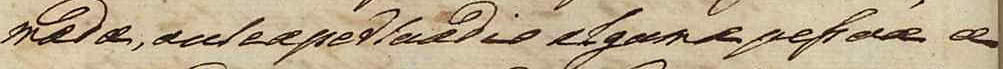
mada, ou se a persuadio aLguma pessoa o
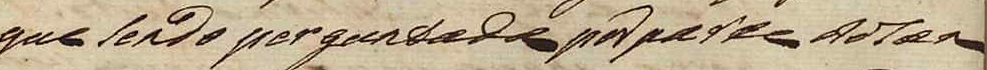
que sendo perguntada por parte do san
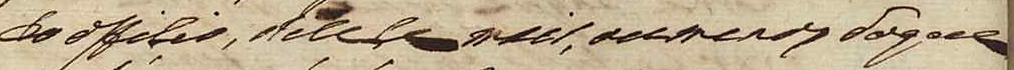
to officio, deçeçe mais, ou menos do que
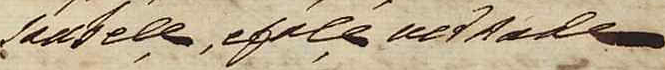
soubeçe, e foçe uerdade.
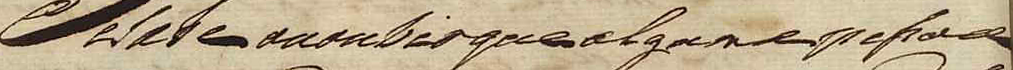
Se sabe ou ouvio que alguma pessoa
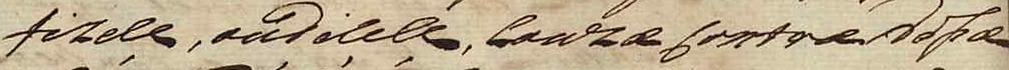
fizeçe, ou diçeçe, couza contra nossa
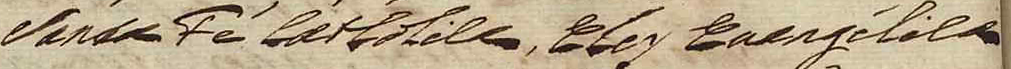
Santa Fé Catholica, E Ley Euangélica
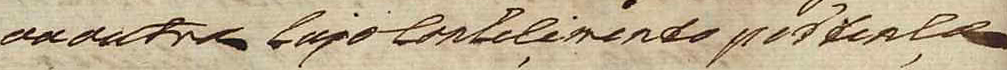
ou outra cujo conheçimento pertença
